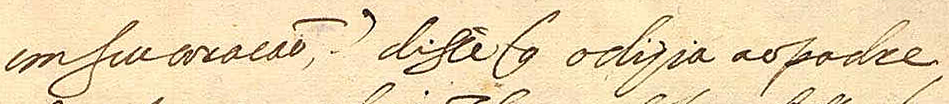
em seu coraçaõ? disse q̄ o dizia ao padre
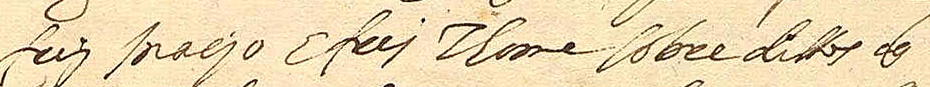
frej Jnacjo E frej Thome sobredittos e q̄
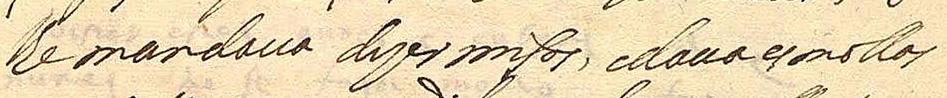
lhe mandaua dizer misas, e daua esmollas
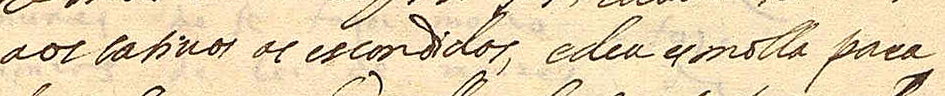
aos catiuos as escondidas, e deu esmolla para
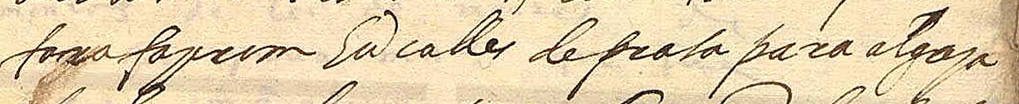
fora fazerem hū calles de prata para a Igreja
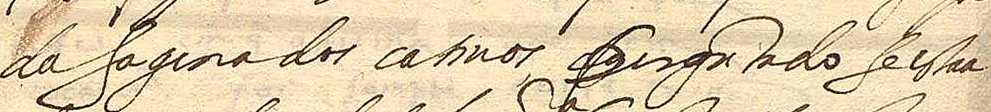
da sagena dos catiuos, Pergūtado se estaa
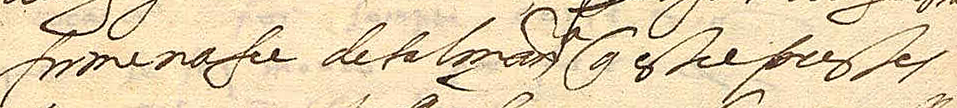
firme na fee de tal manra q̄ estee prestes
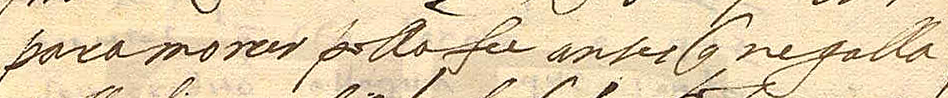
para morrer polla fee antes q̄ negalla
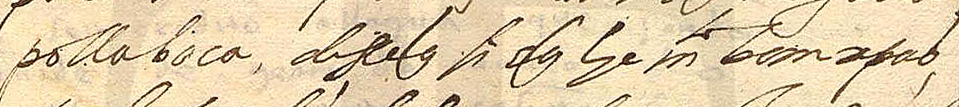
polla boca, disse q̄ si e q̄ he mto bom xpaõ
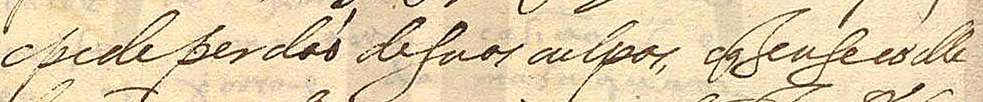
e pede perdaõ de suas culpas, e q̄ se use cō elle
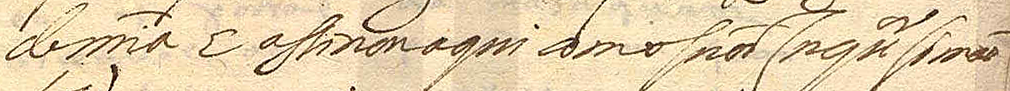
de mīa E assinou aqui com o snōr Jnquor simaõ
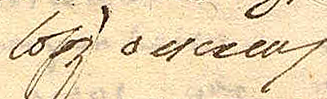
lopz̄ o escreuj
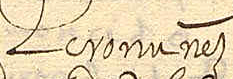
Pero nun̄ez
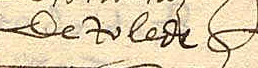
de toledo
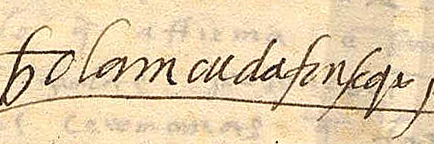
b̄olameu da fonseqa
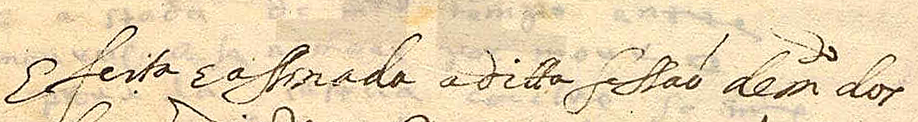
E feita E assinada a ditta sessão de mdo dos
